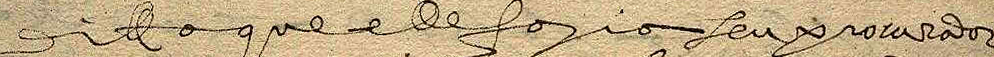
ditto que elle fazia seu procurador
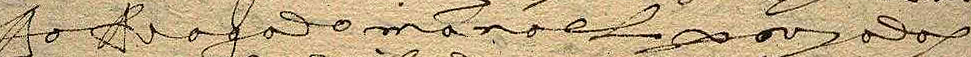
ao avogado manoel pouzados
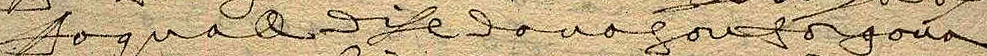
ao qual disse dava e outorgaua
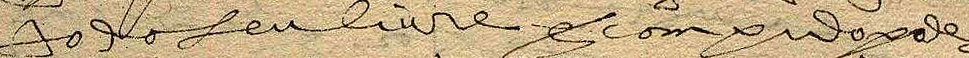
todo seu liure e comprido poder
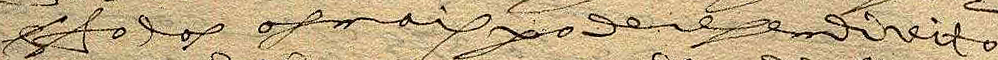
e todos os mais poderes em direito
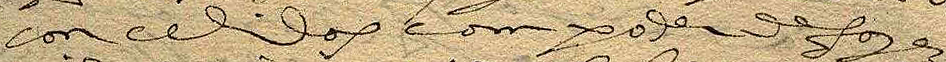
concedidos com poder de fazer
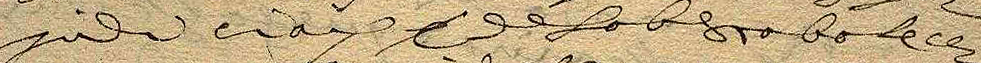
judiciais e de sobestabelecer
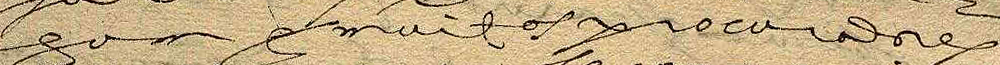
hum e muitos procuradores
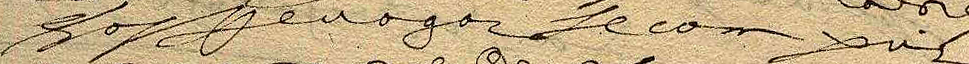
e os revogar se comprir
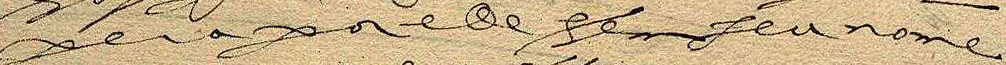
pera por elle e em seu nome
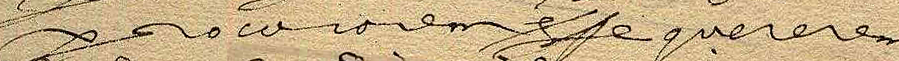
procurarem e requererem
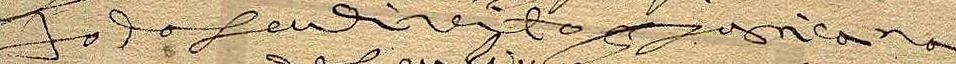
todo seu direito e justiça na
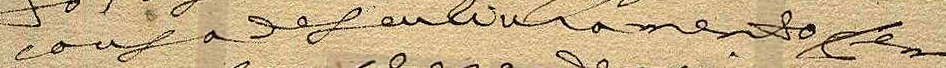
causa de seu liuramento e em
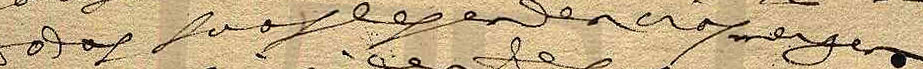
todas suas dependencias e urgen
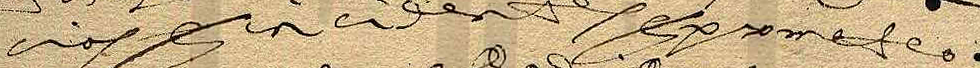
cias e incidentes e prometeo
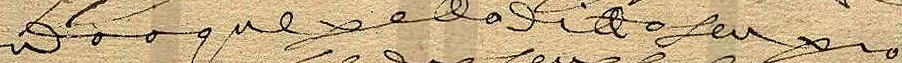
tudo o que pello ditto seu pro
